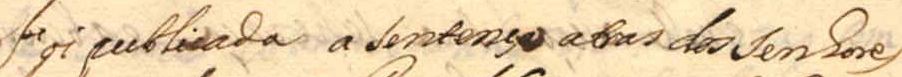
Foi publicada a sentença atras dos senhores
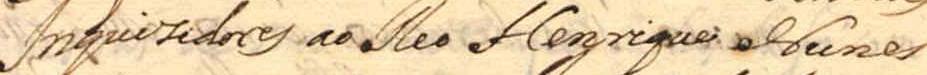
Inquizidores ao Reo Henrique Nunes
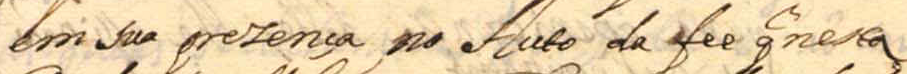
em sua prezença no Auto da fee q̄ nesta
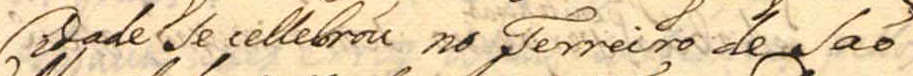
Cidade se cellebrou no Terreiro de Saõ
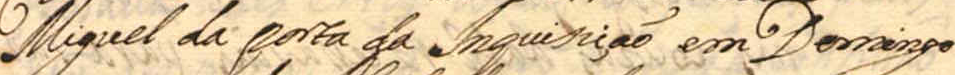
Miguel da porta da Inquisiçaõ em Domingo
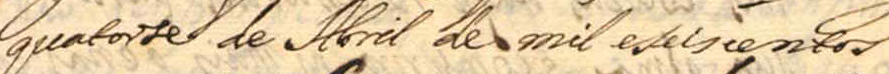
quatorze de Abril de mil e seiscentos
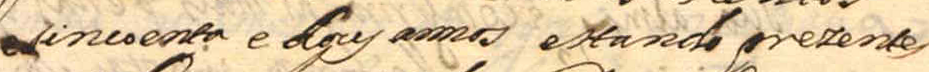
e sinquoenta e dous annos estando prezentes
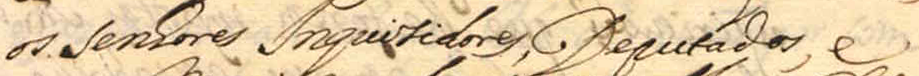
os senhores Inquisidores, Deputados, e
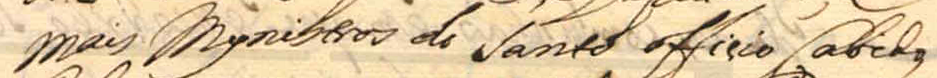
mais Mynistros do Santo officio Cabido,
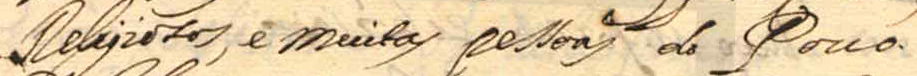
Religiozos, e muitas pessoas do Pouo.
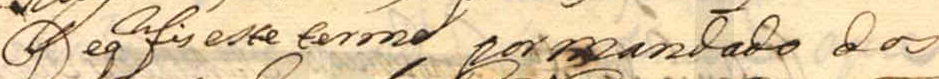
De q̄ fis este termo por mandado dos
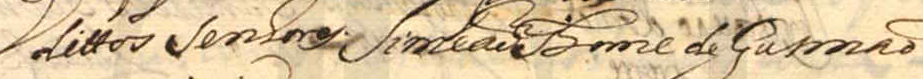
dittos senhores Simeão Thome de Gusmão
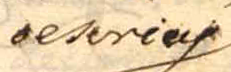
o escriuj
